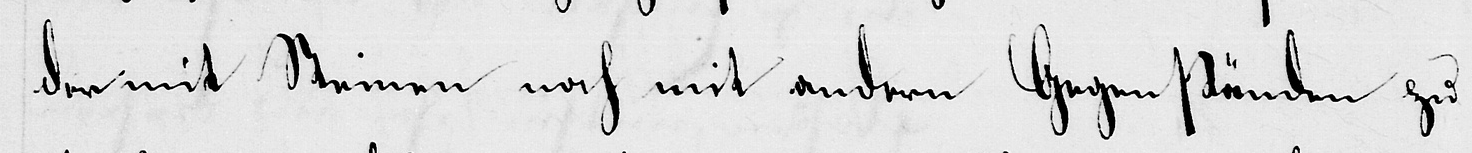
der mit Steinen noch mit andern Gegenständen zu
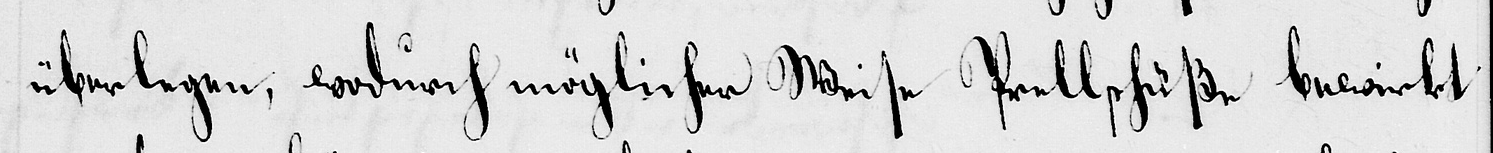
überlegen, wodurch möglicher Weise Prellschüße bewirkt
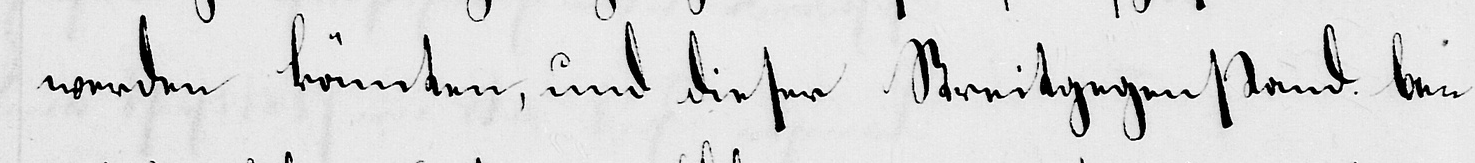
werden könnten, und dieser Streitgegenstand be¬
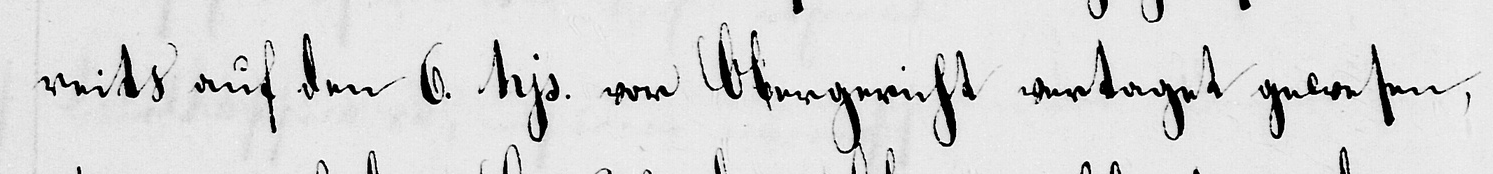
reits auf den 6. hjs. vor Obergericht vertaget gewesen,
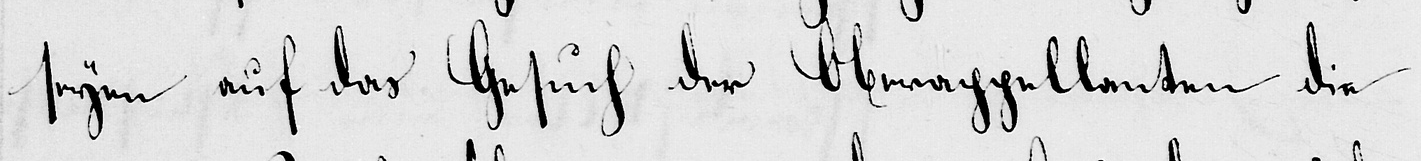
seyen auf das Gesuch der Oberappellanten die
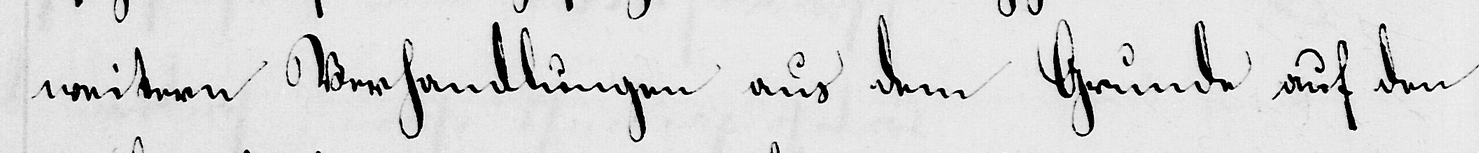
weitern Verhandlungen aus dem Grunde auf den
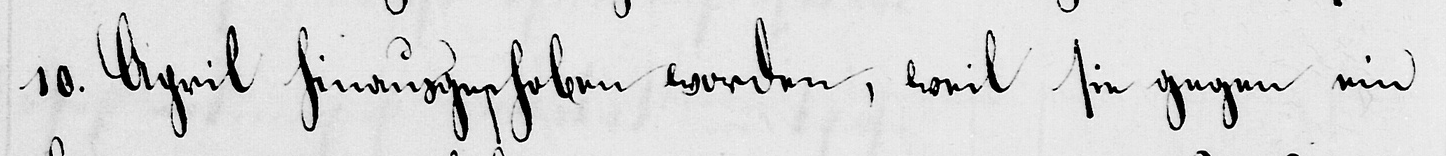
10. April hinausgeschoben worden, weil sie gegen ein
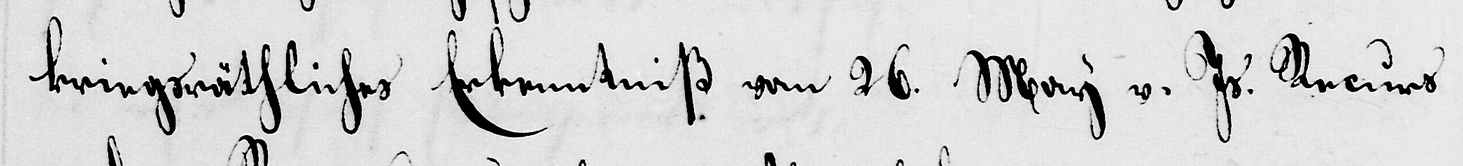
kriegsräthliches Erkenntniß vom 26. May v. Js. Recurs
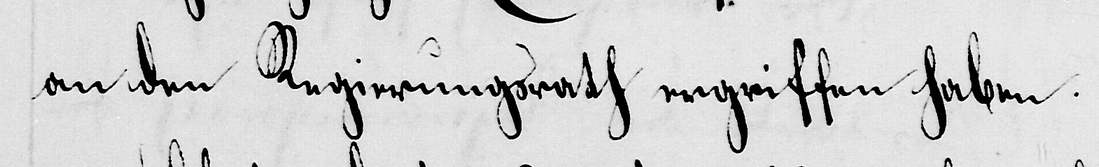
an den Regierungsrath ergriffen haben.
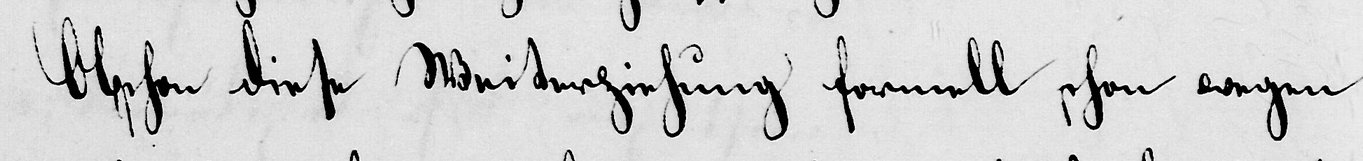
Obschon diese Weiterziehung formell schon wegen
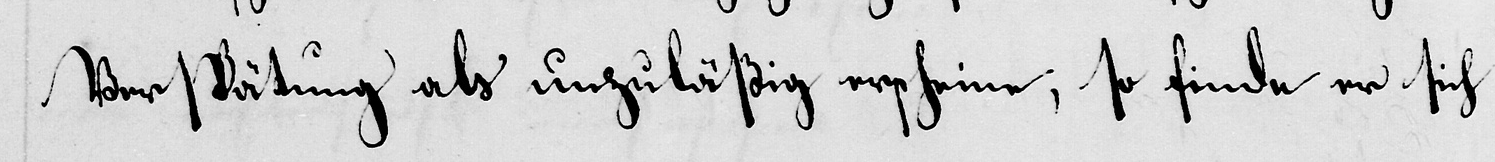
Verspätung als unzuläßig erscheine, so finde er sich
